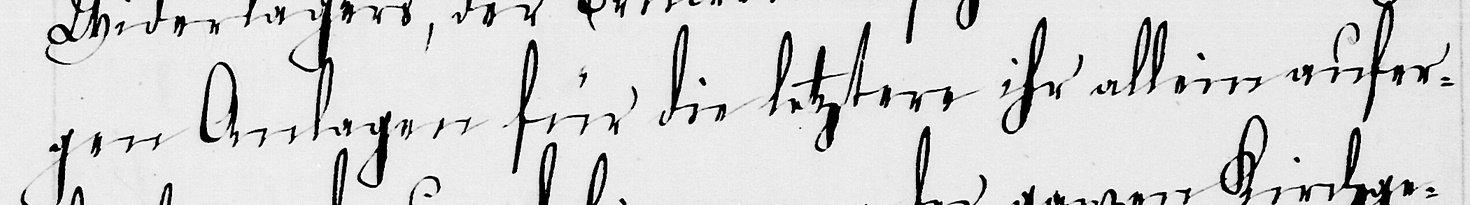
gen Anlagen für die letztere ihr allein aufer¬
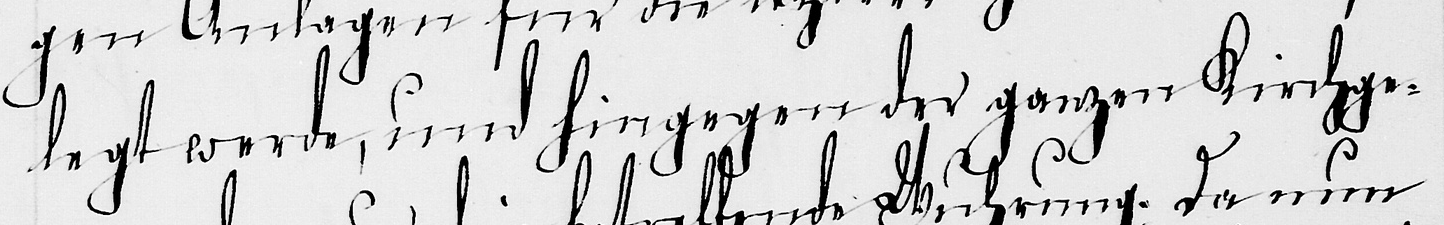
legt werde, und hingegen der ganzen Kirchge¬
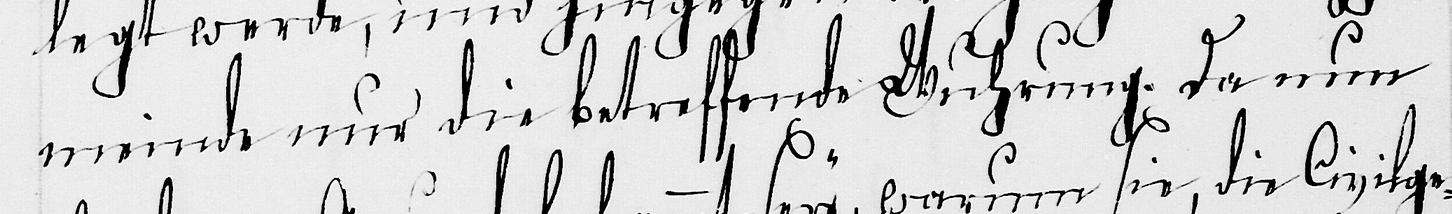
meinde nur die betreffende Wuhrung. Da nun
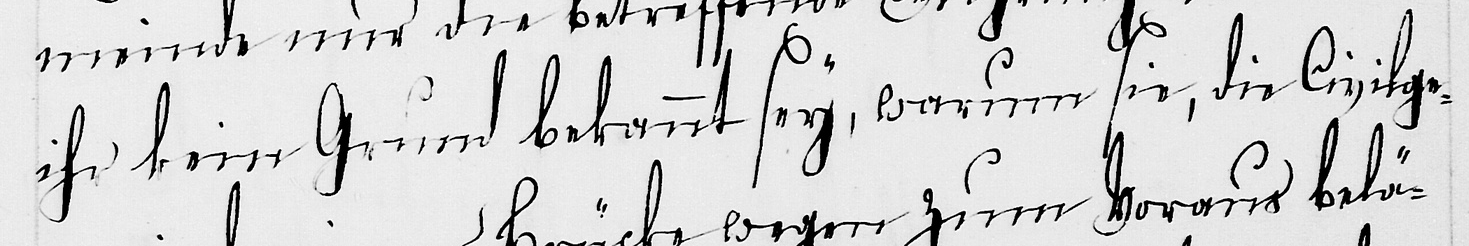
ihm kein Grund bekannt sey, warum sie, die Civilge¬
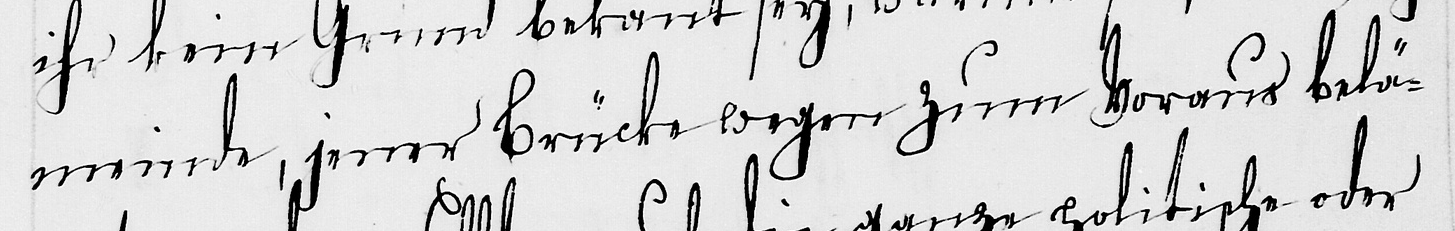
meinde, jener Brücke wegen zum Voraus belä¬
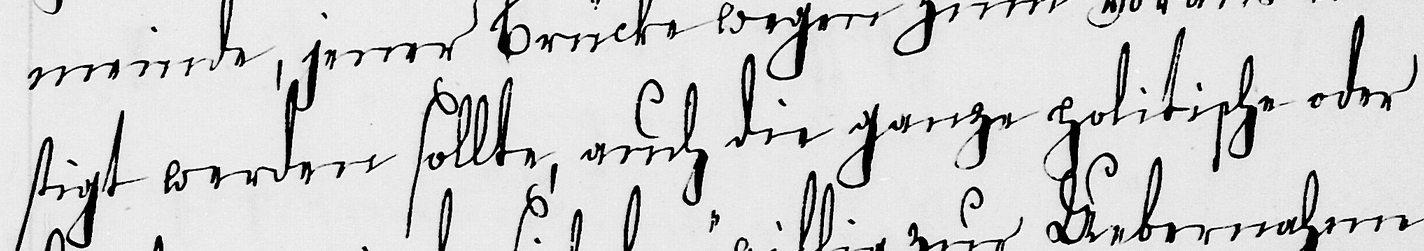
stigt werden sollte, auch die ganze politische oder
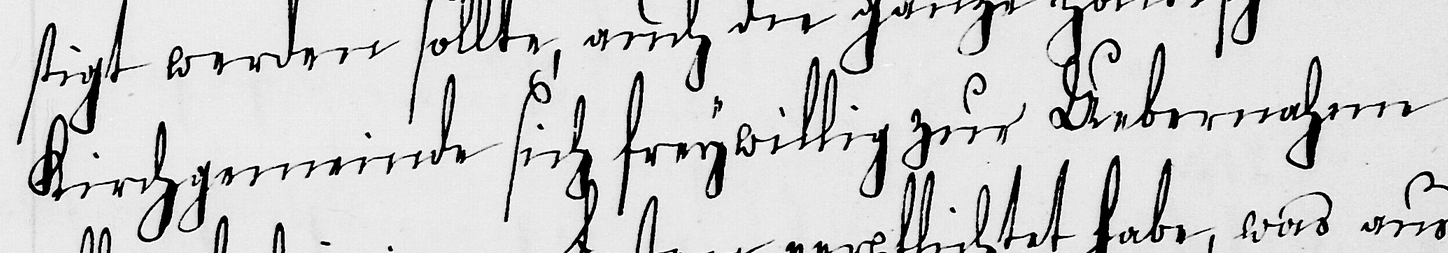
Kirchgemeinde sich freywillig zur Uebernahme
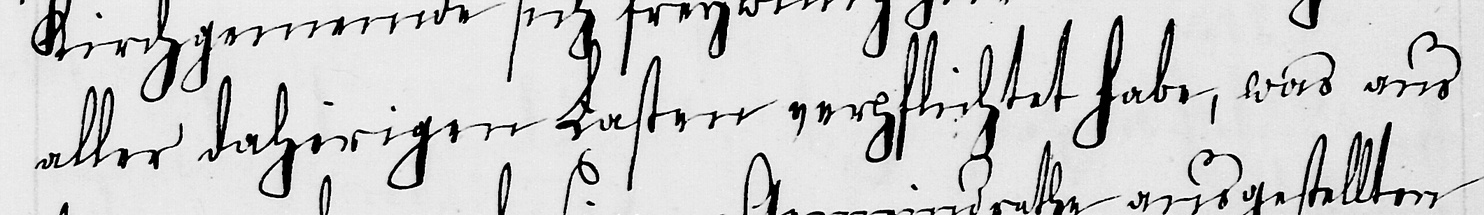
aller daherigen Lasten verpflichtet habe, was aus
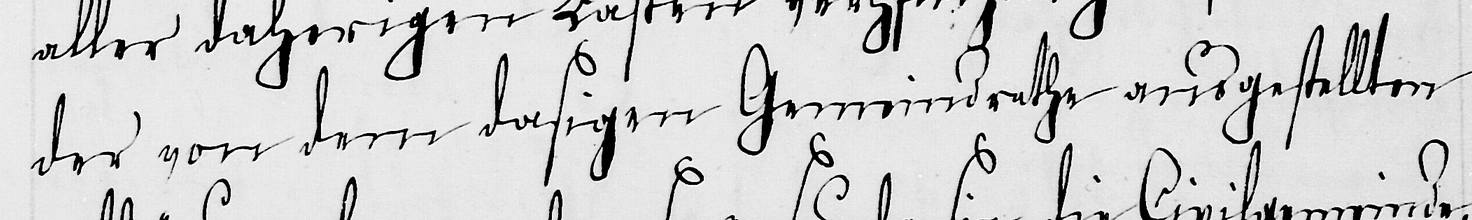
der von dem dasigen Gemeindrathe ausgestellten
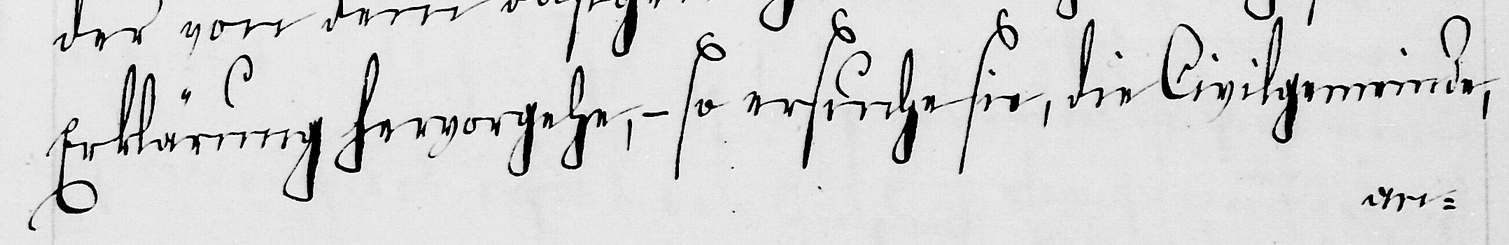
Erklärung hervorgehe, – so ersuche sie, die Civilgemeinde,
